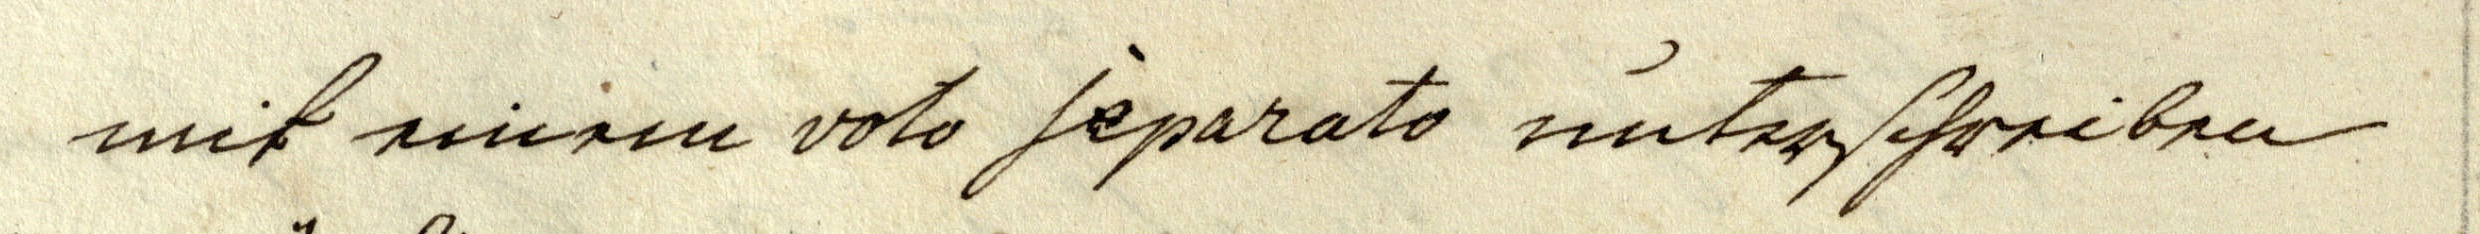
mit einem voto separato unterschreiben
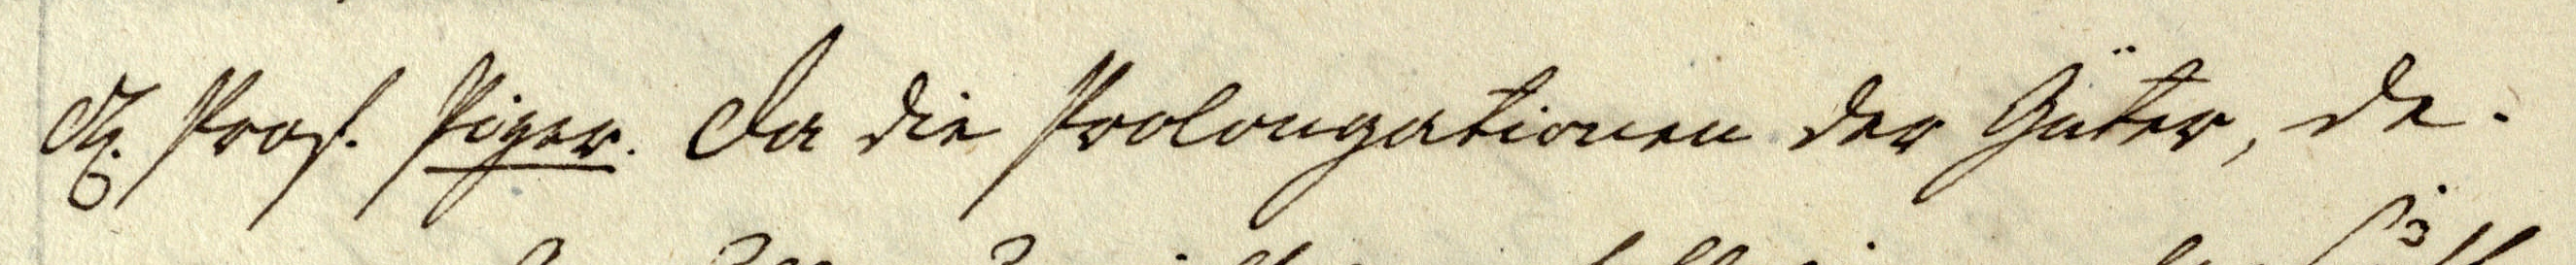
dh. Prof. Piper. Da die Prolongationen der Güter, de¬
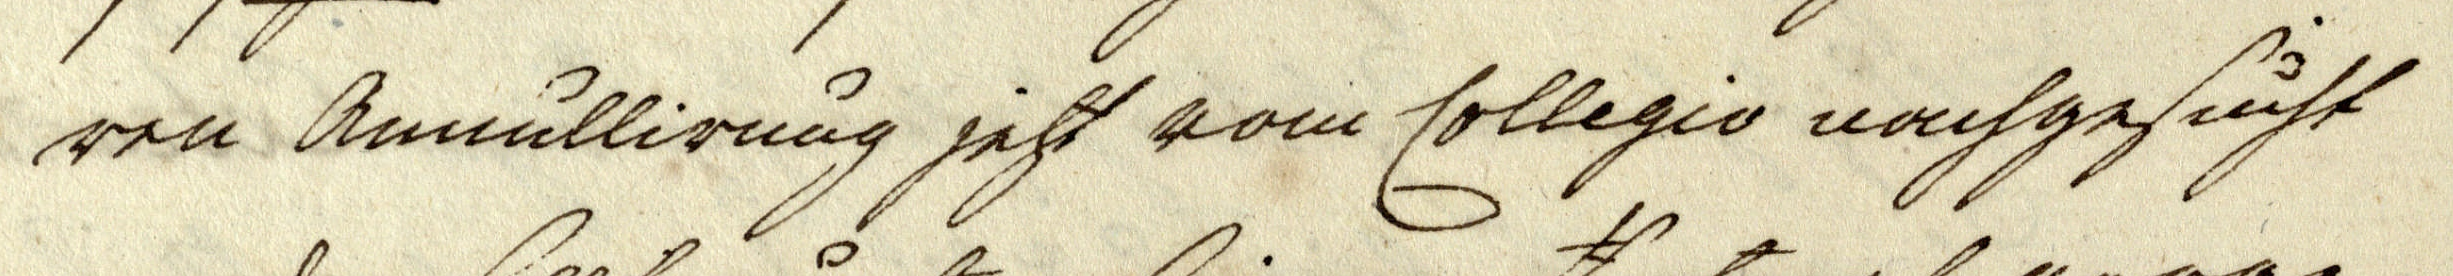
ren Annullirung jetzt vom Collegio nachgesucht
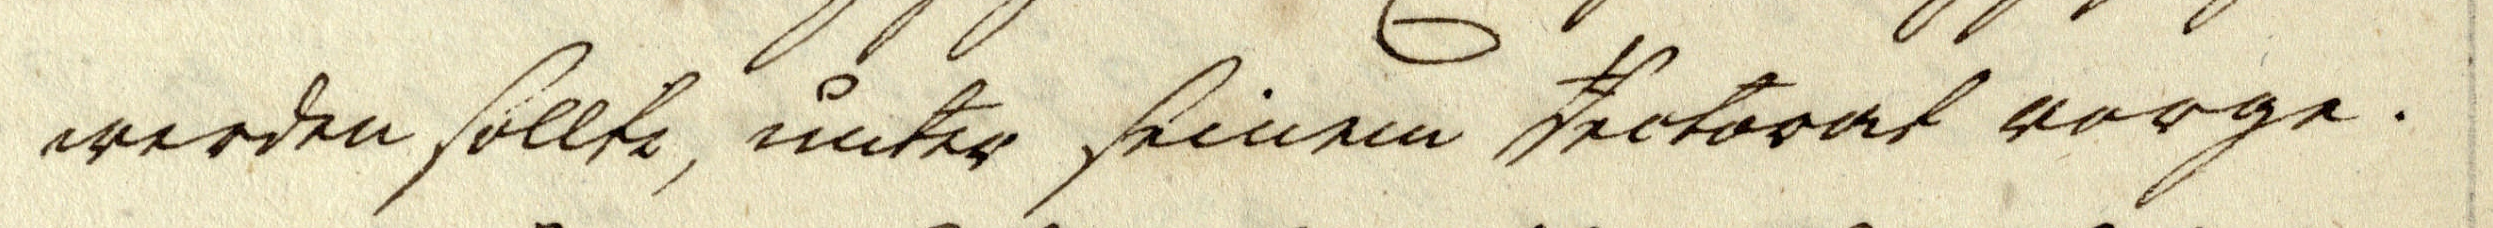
werden sollte, unter seinem Rectorat vorge¬
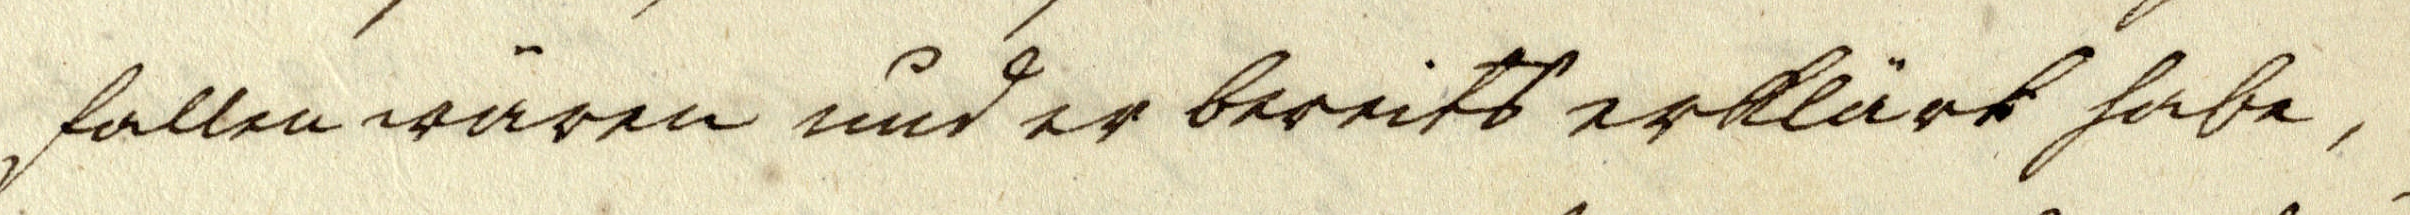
fallen wären und er bereits erklärt habe,
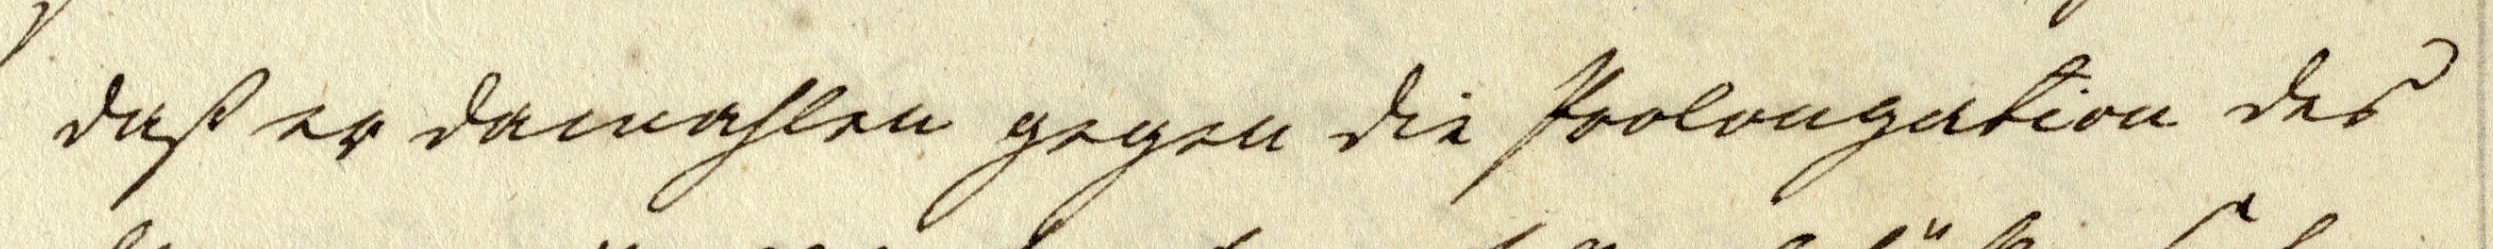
daß er damahlen gegen die Prolongation des
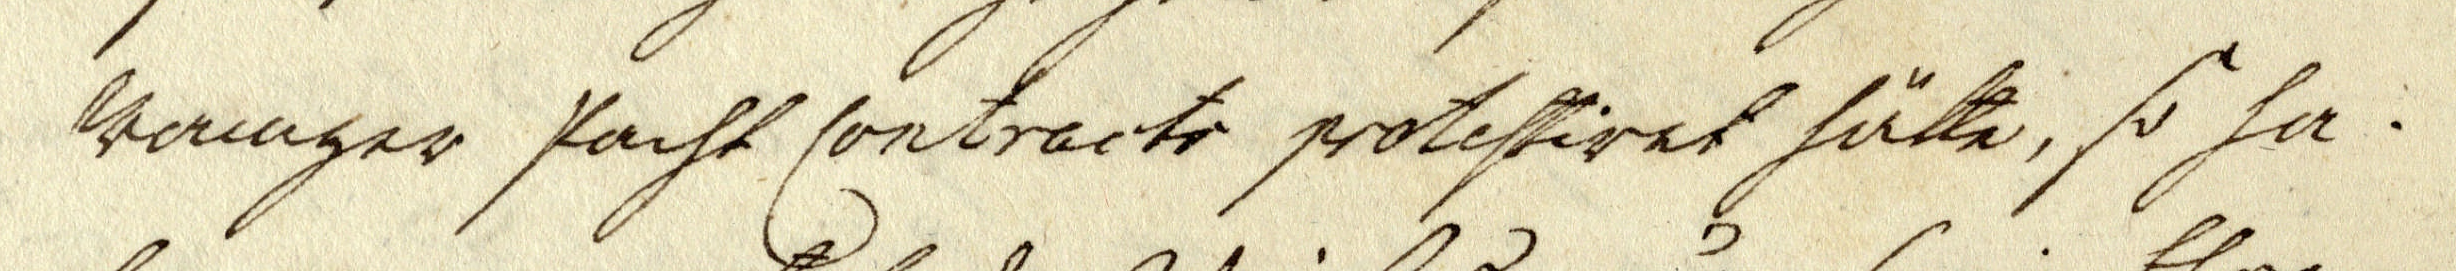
Wamper Pacht Contracts protestiret hätte, so ha¬
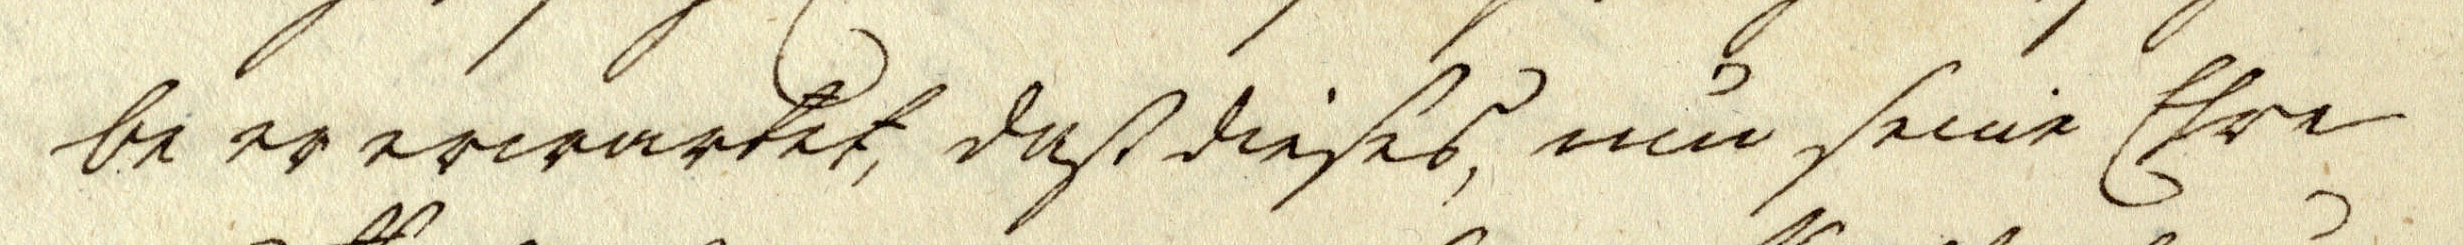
be er erwartet, daß dieses, um seine Ehre
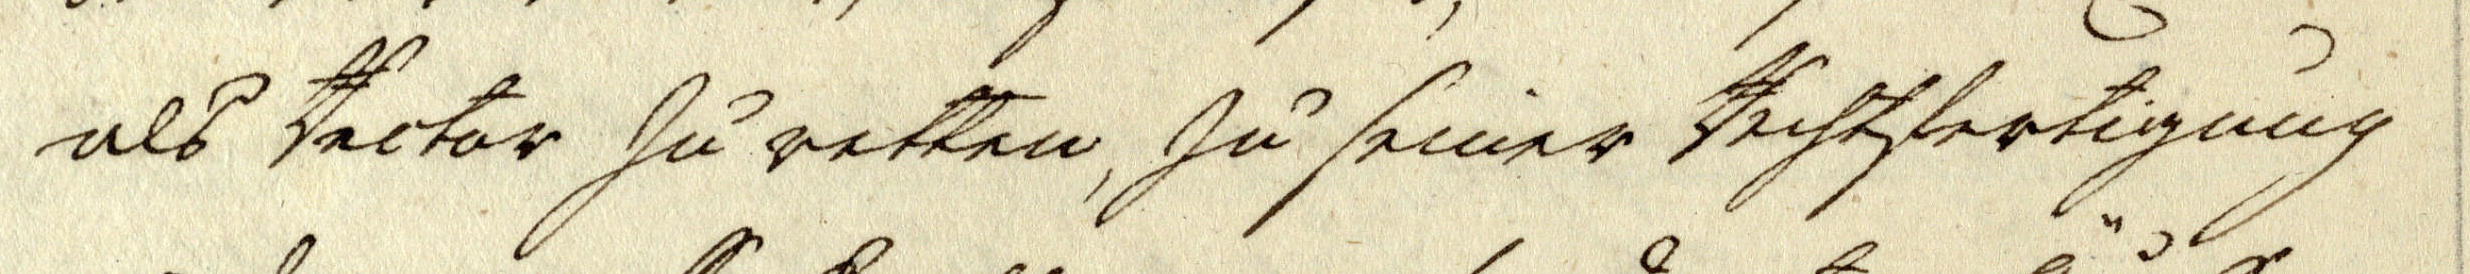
als Rector zu retten, zu seiner Rechtfertigung
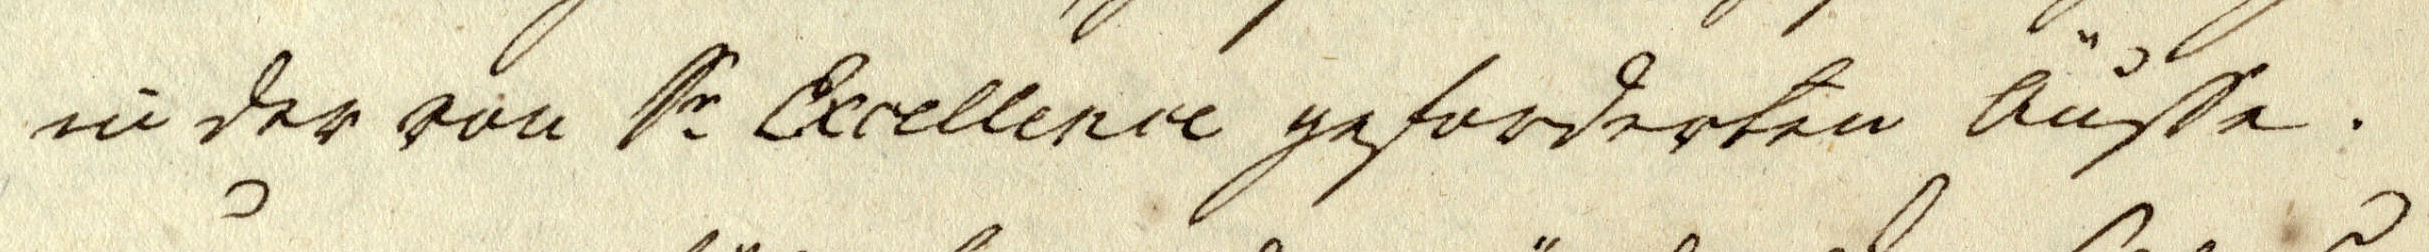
in der von Sr Excellence geforderten Äusse¬
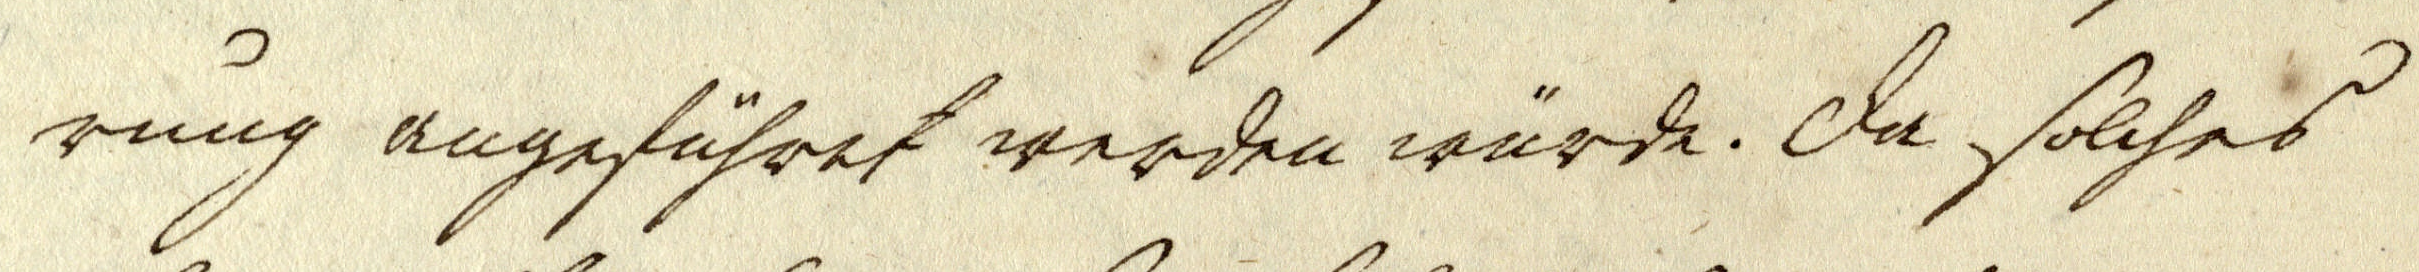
rung angeführet werden würde. Da solches
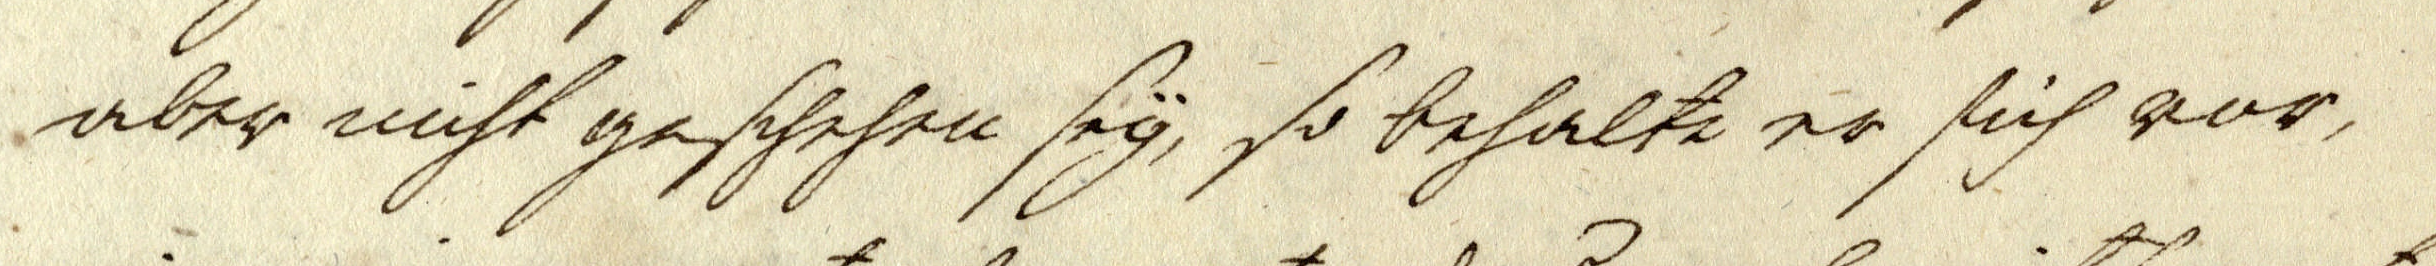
aber nicht geschehen seÿ, so behalte er sich vor,
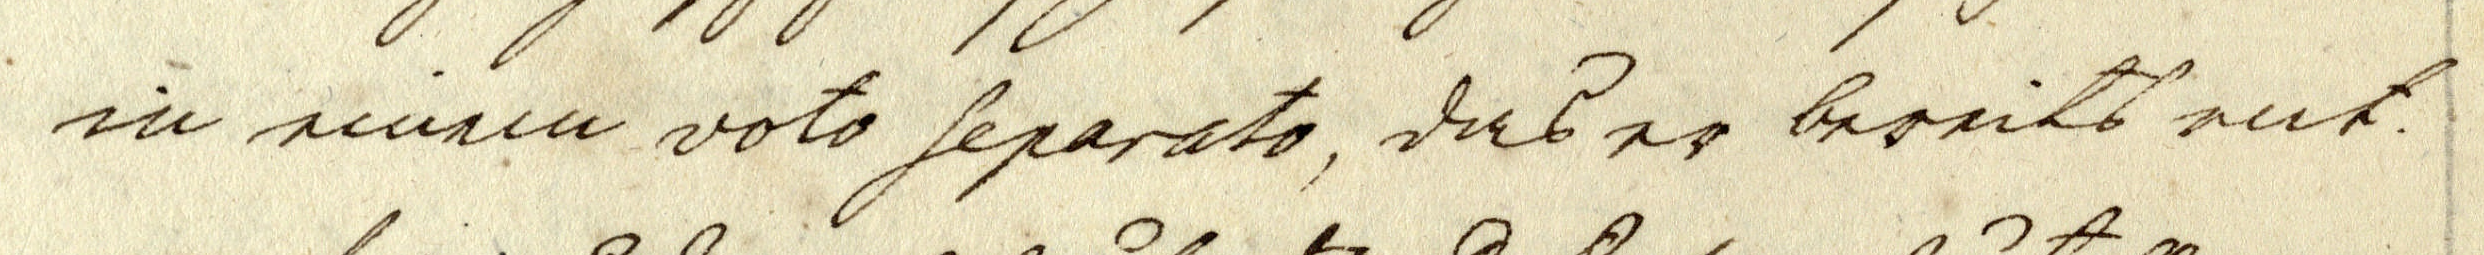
in einem voto separato, das er bereits ent¬
